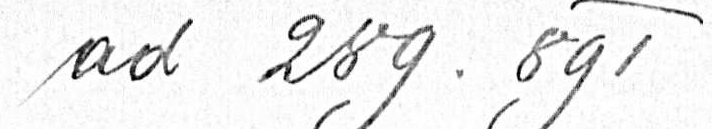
Ad 289 1891
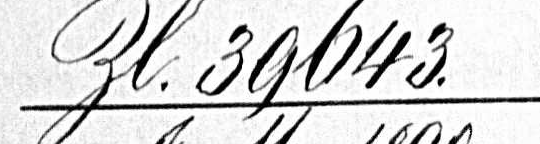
Zl 39643
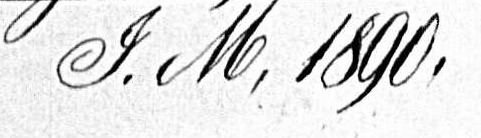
I. M. 1890
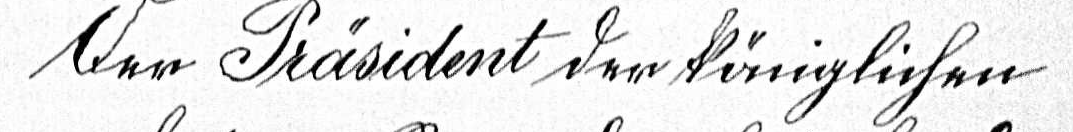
Der Präsident der königlichen
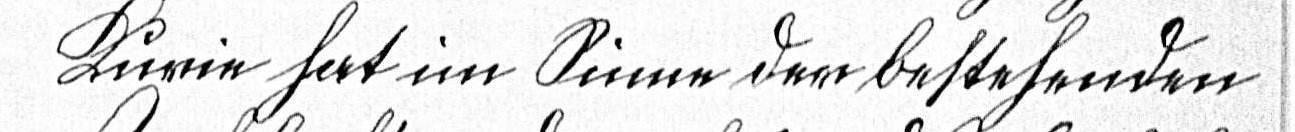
Curie hat im Sinne der bestehenden
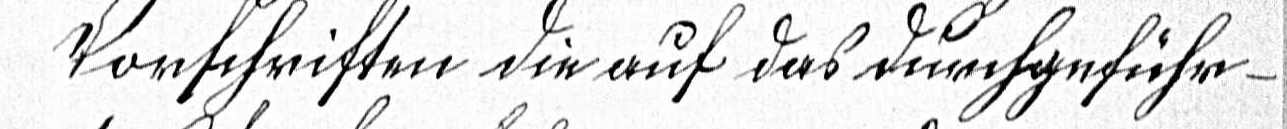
Vorschriften die auf das Durchgeführ¬
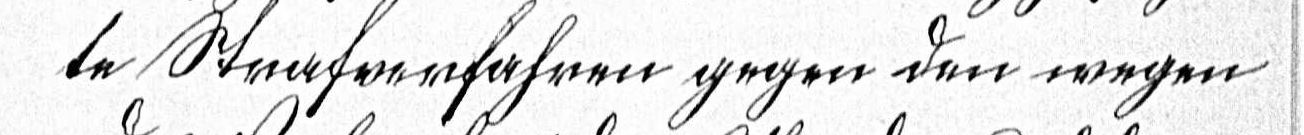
te Strafverfahren gegen den wegen
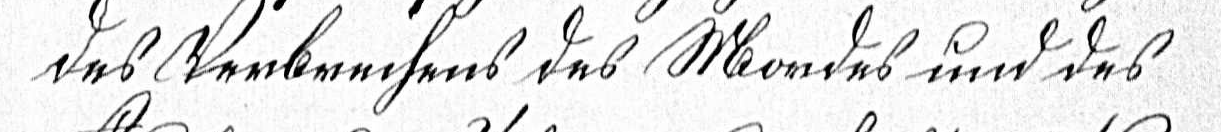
des Verbrechens des Mordes und des
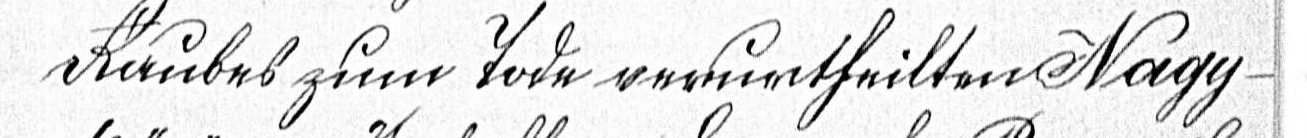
Raubes zum Tode verurtheilten Nagy¬
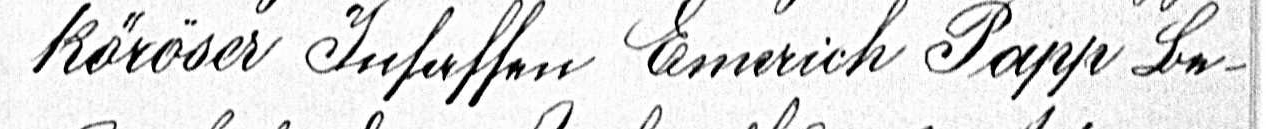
kőröser Insassen Emerich Papp Be-
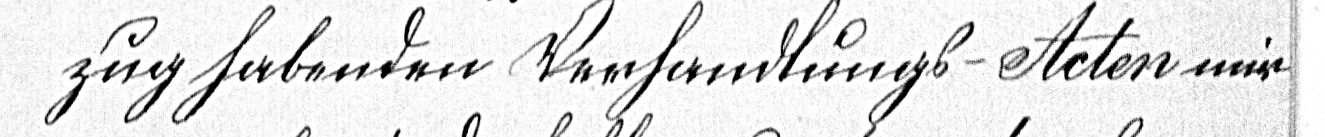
zug habenden Verhandlungs-Acten mir
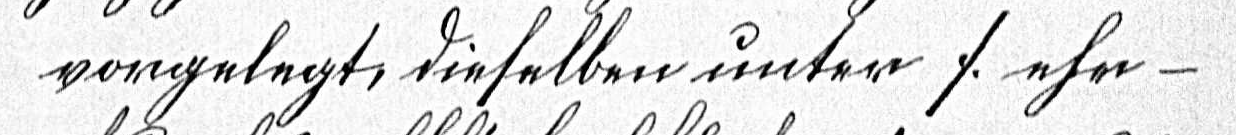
vorgelegt, dieselben unter % her¬
